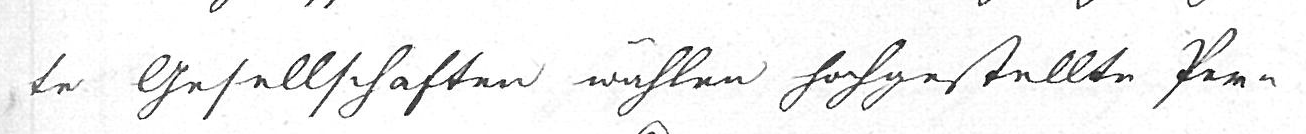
te Gesellschaften wählen hochgestellte Per-
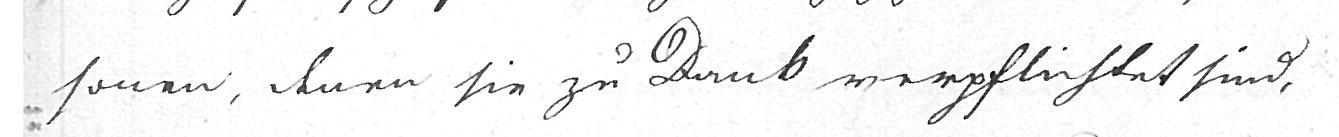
sonen, deren sie zu Dank verpflichtet sind,
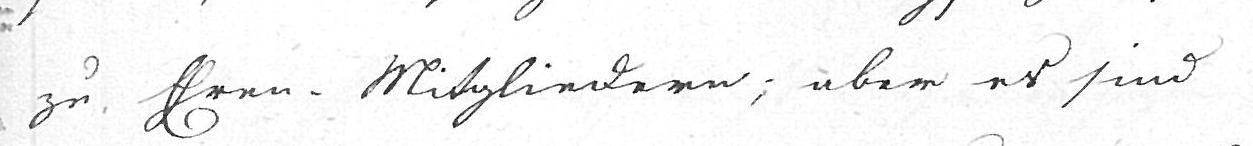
zu Ehren-Mitgliedern; aber es sind
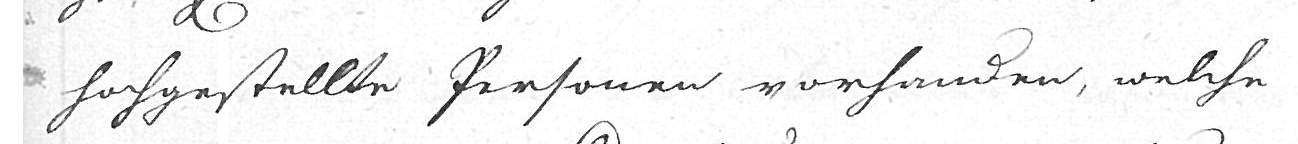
hochgestellte Personen vorhanden, welche
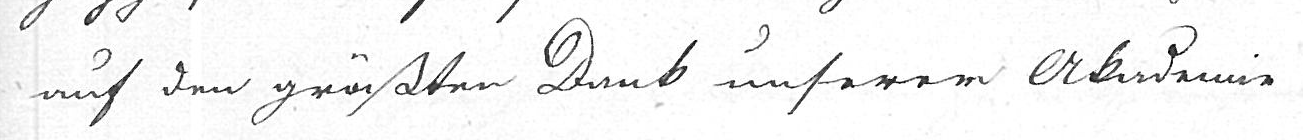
auf den größten Dank unserer Akademie
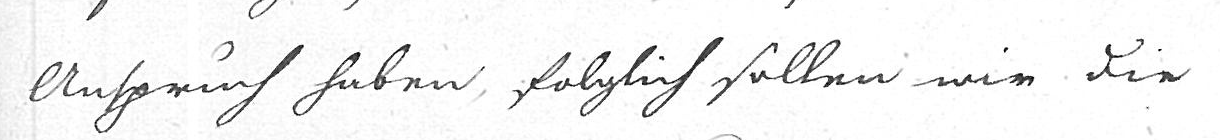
Anspruch haben, folglich sollen wir die
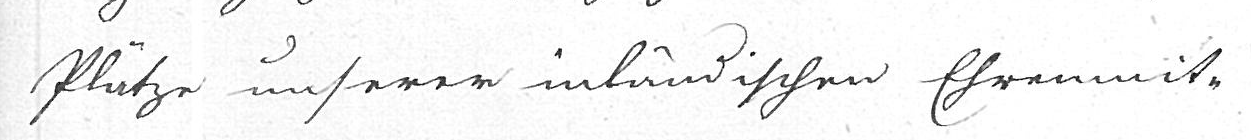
Plätze unserer inländischen Ehrenmit-
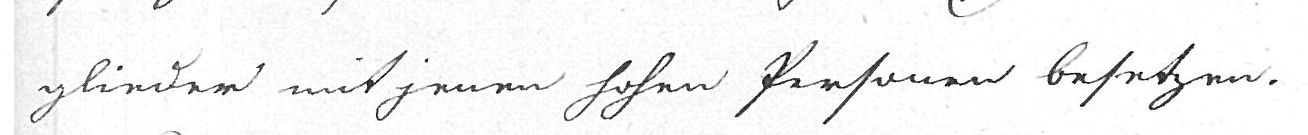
glieder mit jenen hohen Personen bestzen.
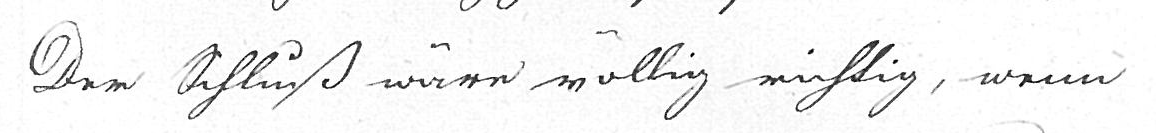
Der Schluß wäre völlig richtig, wenn
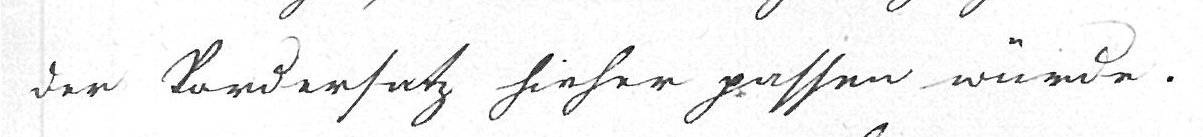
der Vordersatz hieher passen würde.
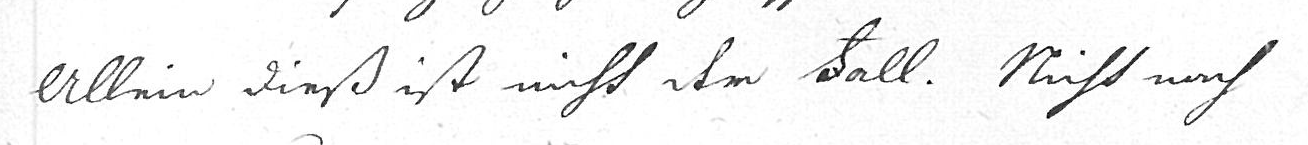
Allein dieß ist nicht der Fall. Nicht nach
